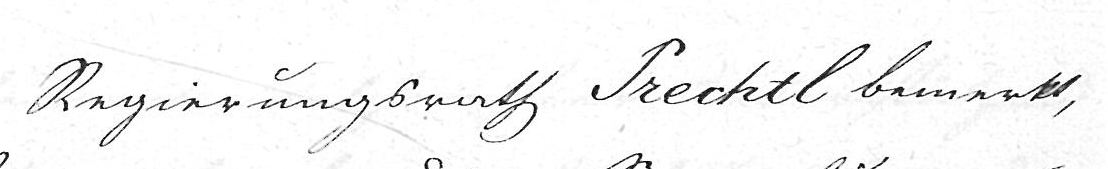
Regierungsrath Prechtl bemerkt,
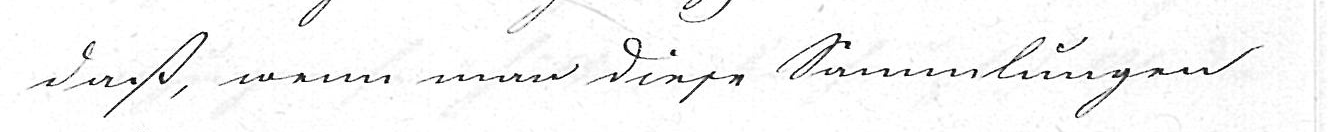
daß, wenn man diese Sammlungen
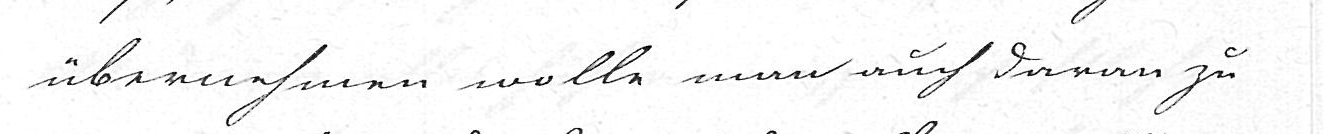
übernehmen wolle man auch daran zu
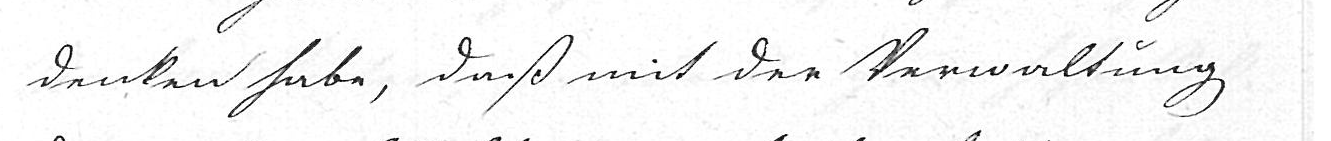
denken habe, daß mit der Verwaltung
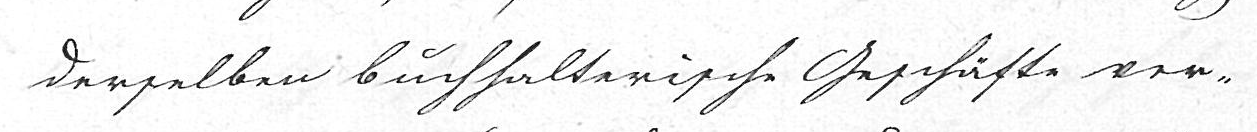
derselben buchhalterische Geschäfte ver-
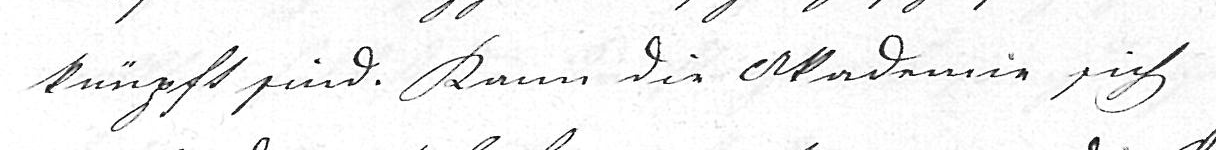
knüpft sind. Kann die Akademie sich
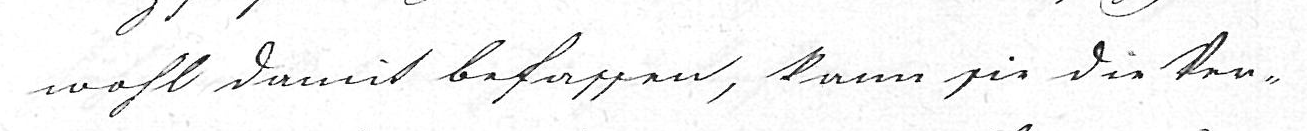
wohl damit befassen, kann zu die Ver-
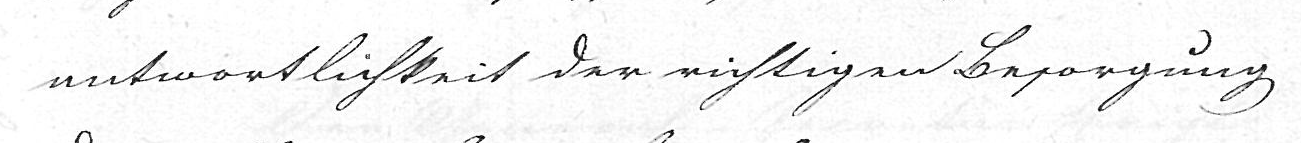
antwortlichkeit der richtigen Besorgung
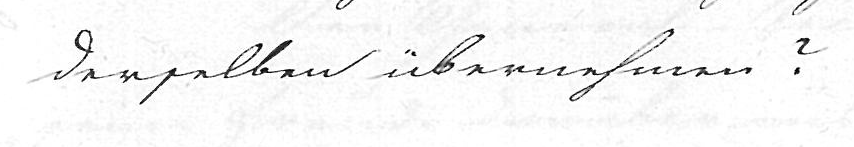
derselben übernehmen?
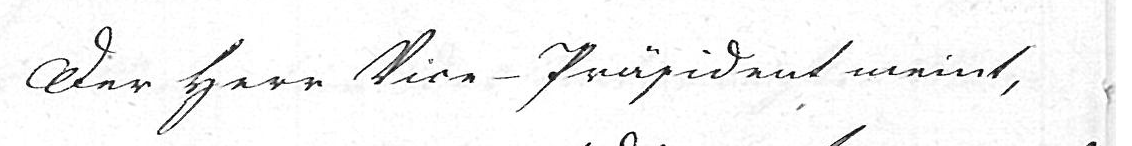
Der Herr Vice-Präsident meint,
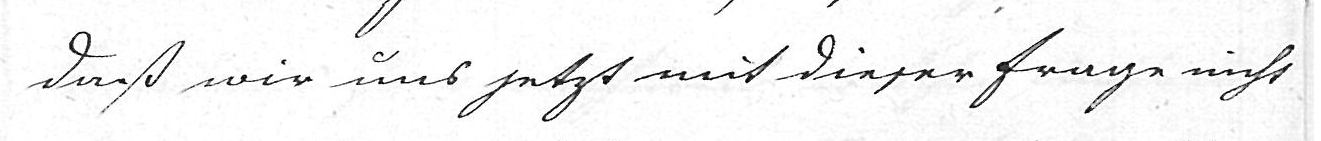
daß wir uns jetzt mit dieser Frage nicht
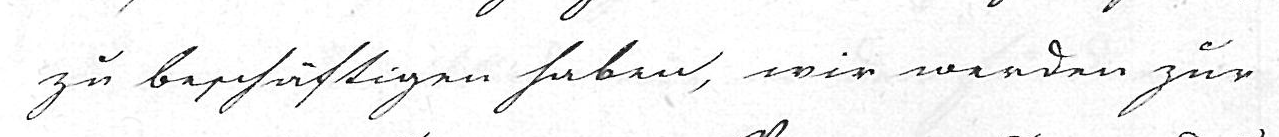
zu beschäftigen haben, wir werden zur
